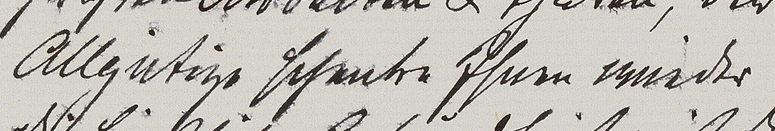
Allgütige schenke Ihnen wieder
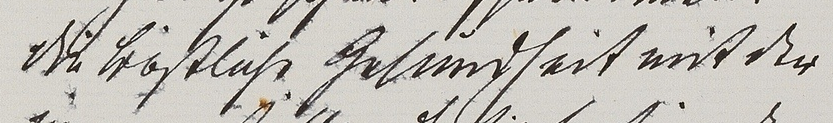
die köstliche Gesundheit mit der
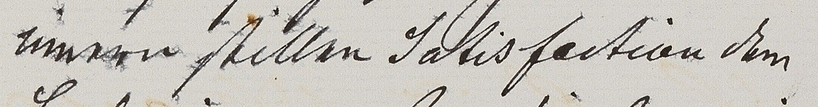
innern stillen Satisfaction dem
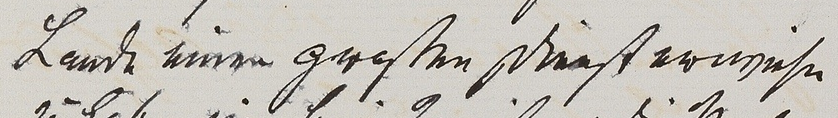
Lande einen großen Dienst erwiesen
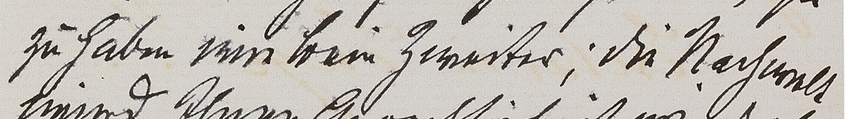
zu haben wie kein Zweiter; die Nachwelt
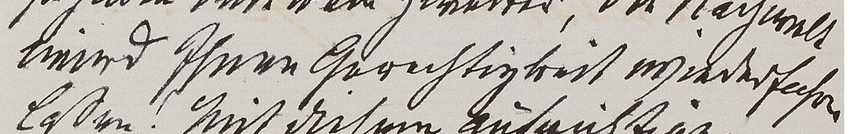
wird Ihnen Gerechtigkeit wiederfahren
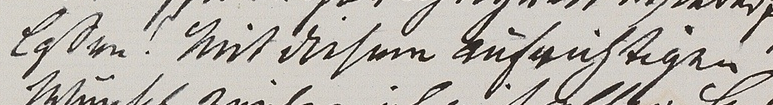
lassen! Mit diesem aufrichtigen
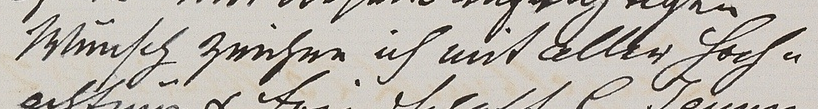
Wunsch zeichne ich mit aller Hoch-
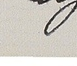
C.
